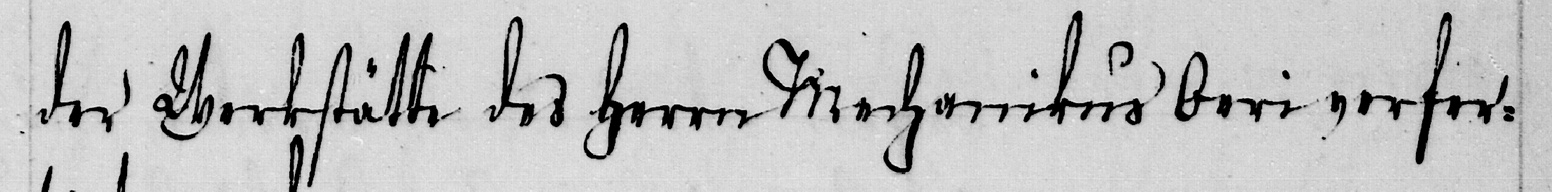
der Werkstätte des Herrn Mechanikus Oeri verfer¬
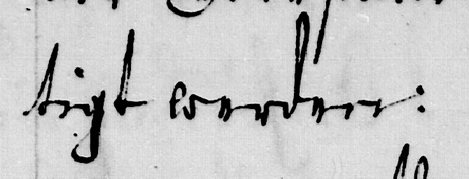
tigt werden:
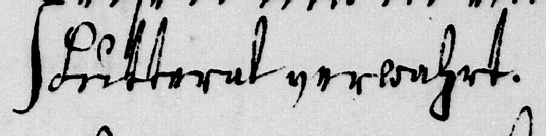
Futteral verwahrt.
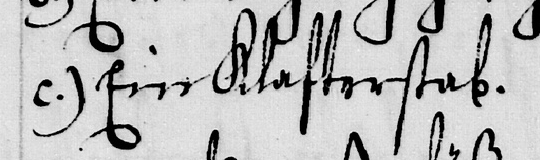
c.) Ein Klaftersta¬
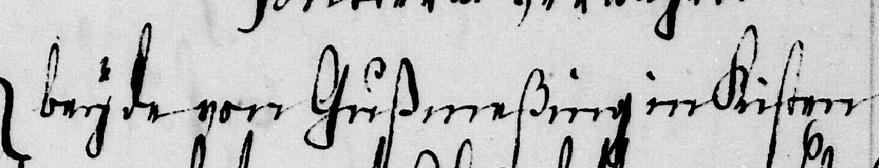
beyde von Gußmeßing in Kisten
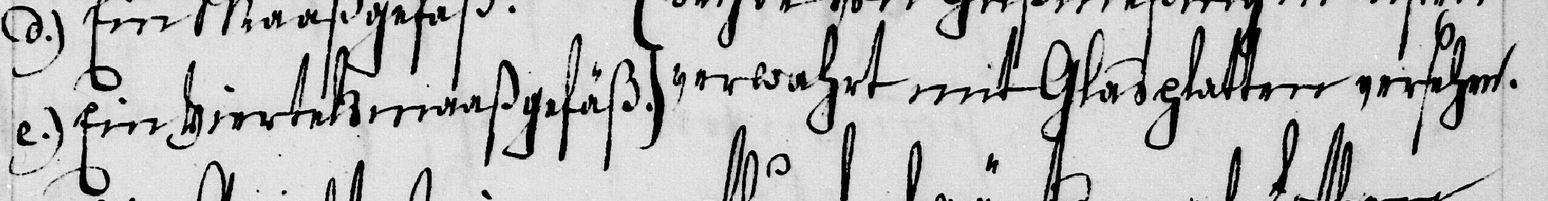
e.) Ein Viertelsmaaßgefäß. verwahrt mit Glasplatten versehen.
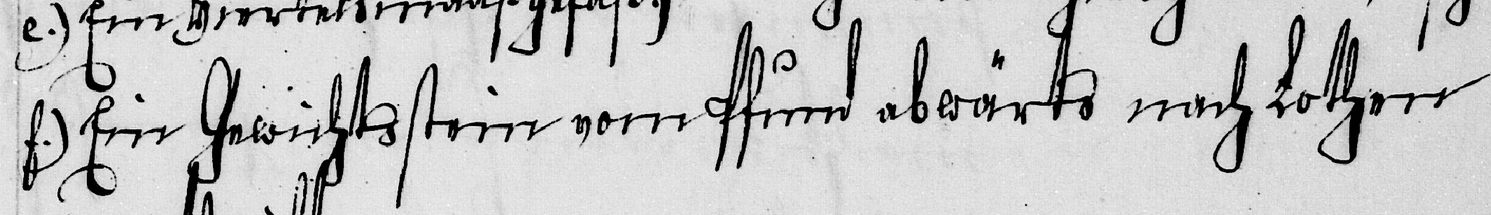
f.) Ein Gewichtsstein vom Pfund abwärts nach Lothen
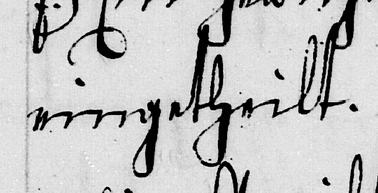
eingetheilt.
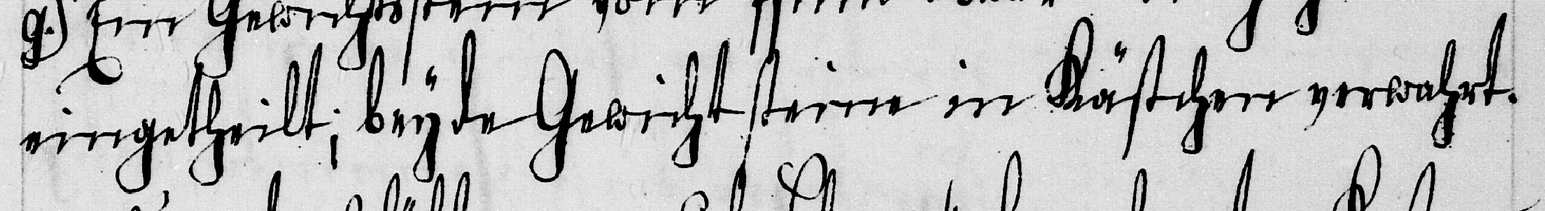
eingetheilt; beyde Gewichtsteine in Kästchen verwahrt.
